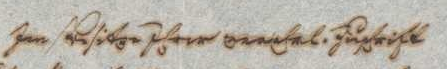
Im Besitze Ihrer verehrl. Zuschrift
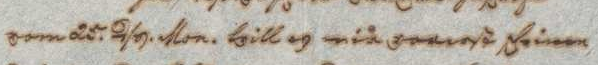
vom 25. dss. Mon. will es mir vorerst scheinen,
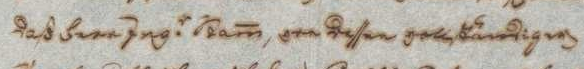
daß Herr IngrStamm, von dessen vollständiger
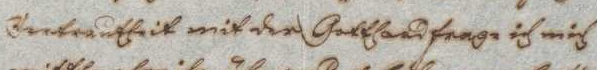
Vertrautheit mit der Gotthardfrage ich mich
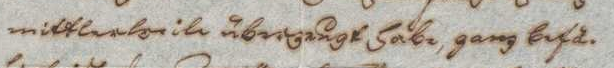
mittlerweile überzeugt habe, ganz befä-
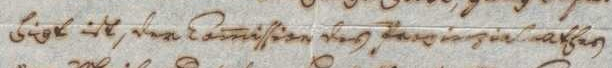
higt ist, der Commission des Provinzialrathes
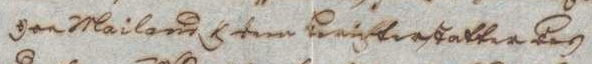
von Mailand & dem Berichterstatter des
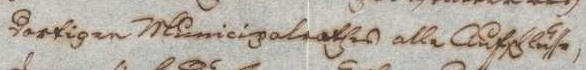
dortigen Municipalrathes alle Aufschlüsse,
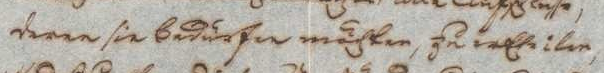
deren sie bedürfen möchten, zu ertheilen,
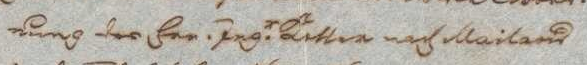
nung des Hrn. IngrKoller nach Mailand
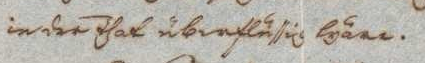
in der That überflüssig wäre.
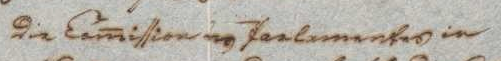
Die Commission des Parlamentes in
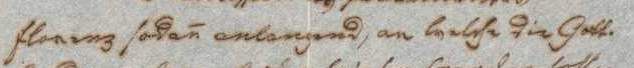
Florenz sodann anlangend, an welche die Gott-
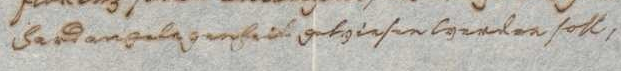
hardangelegenheit gewiesen werden soll,
